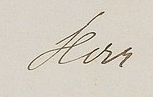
Herr
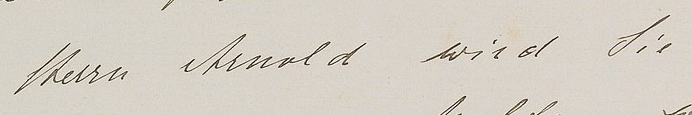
Herrn Arnold wird Sie
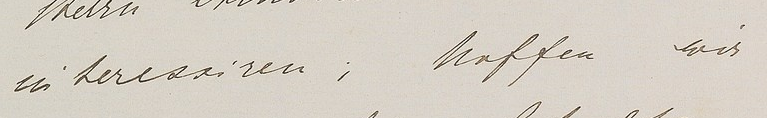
interessiren; hoffen wir
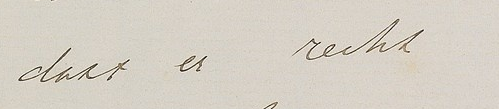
dass er recht behalte.
